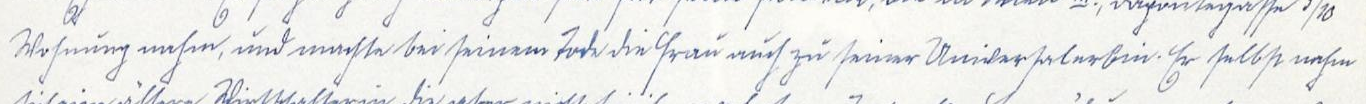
Wohnung nahm, und machte bei seinem Tode die Frau auch zu seiner Universalerbin. Er selbst nahm
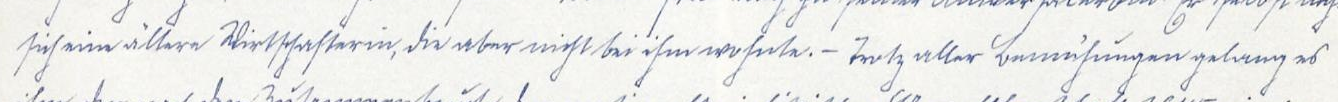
sich eine ältere Wirtschafterin, die aber nicht bei ihm wohnte. - Trost aller Bemühungen gelang es
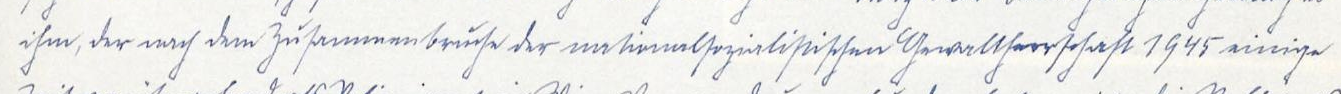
ihm, der nach dem Zusammenbruche der nationalsozialistischen Gewaltherrschaft 1945 einige
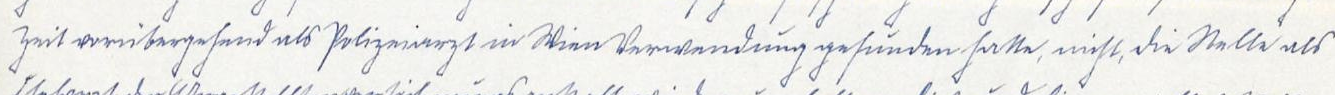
Zeit vorübergehend als Polizeiarzt im Wien Verwendung gefunden hatte, nicht, die Stelle als
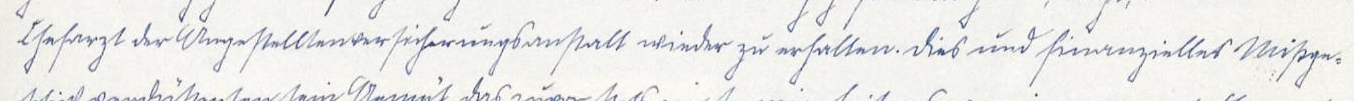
Chefarzt der Angestelltenversicherungsanstalt wieder zu erhalten. Dies und finanziell Mißge-
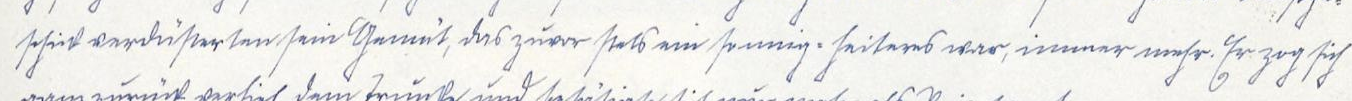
schicke verdüsterten sein Gemät, das zuvor stets ein sonnig -heiteres war, immer mehr. Er zog sich
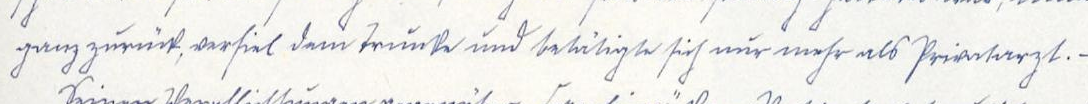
ganz zurück, verfal dem Trunke und betätigte sich nur mehr als Privatarzt.
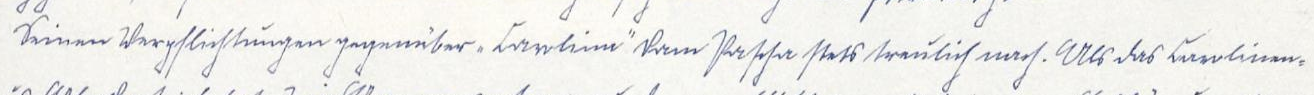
Seinen Verpflichtungen gegenüber "Carolina" kam Pascha stets treulich nach. Als das Carolinen-
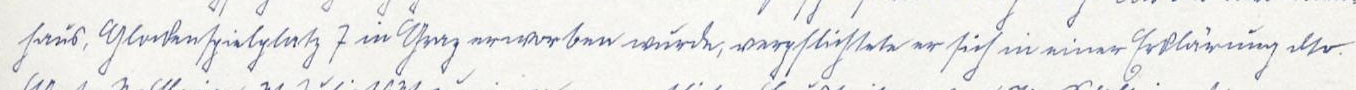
haus, Glockenspielplatz 7 in Graz erworben wurde, verpflichtete er sich in einer Erklärung dto.
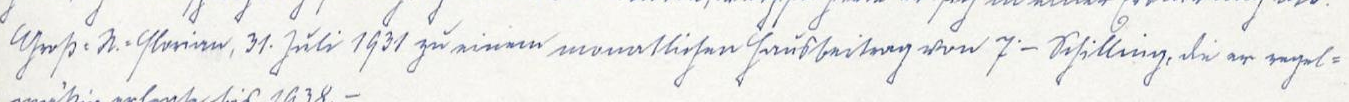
Groß:- St. Florian, 31. Juli 1931 zu einen monatlichen Hausbeitrag von 7.- Schilling, die er rege-
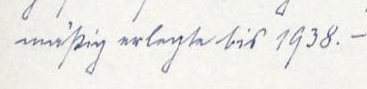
mäßig erlegte bis 1938.-
